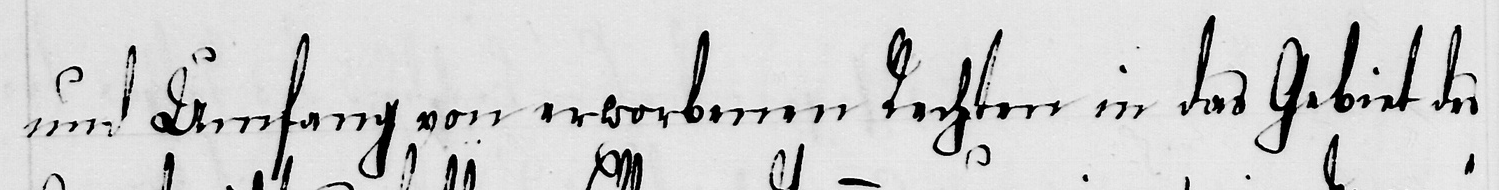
und Umfang von erworbenen Rechten in das Gebiet des
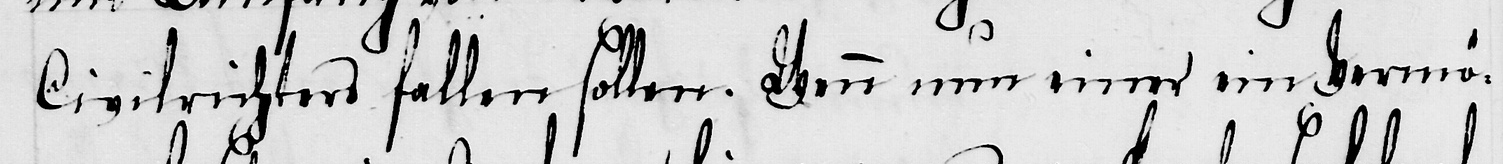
Civilrichters fallen sollen. Wenn nun einer ein Vermö¬
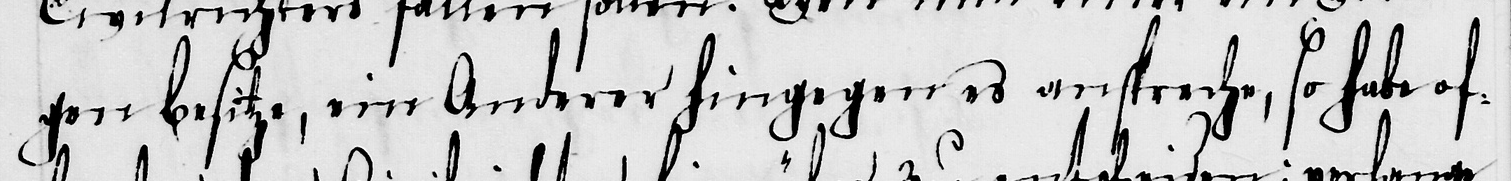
gen besitze, ein Anderer hingegen es anspreche, so habe of¬
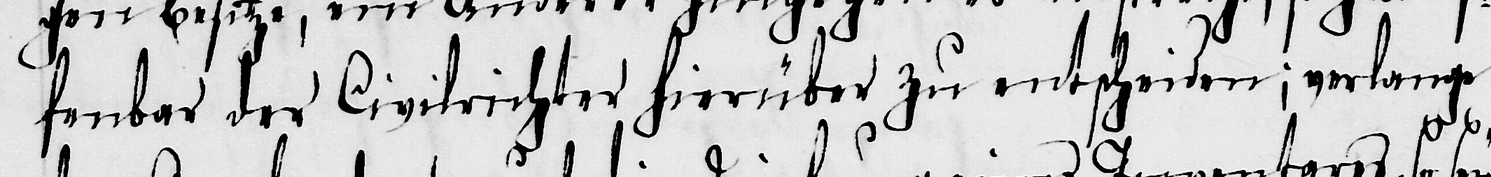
fenbar der Civilrichter hierüber zu entscheiden; verlange
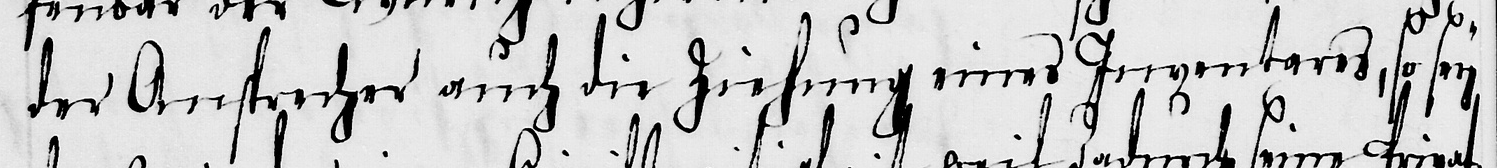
der Ansprecher auch die Ziehung eines Inventares, so sey
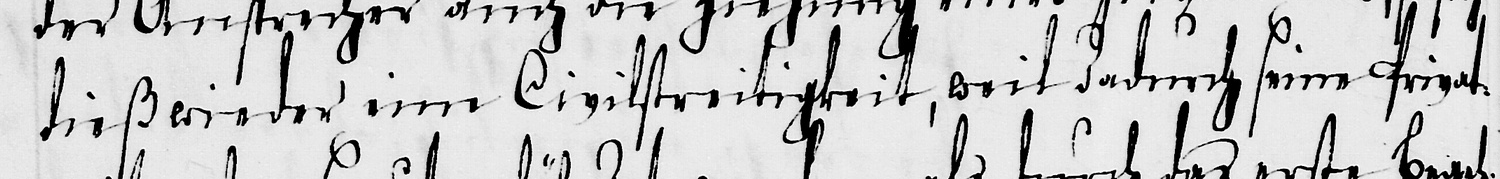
dieß wieder eine Civilstreitigkeit, weil dadurch seine Priva¬
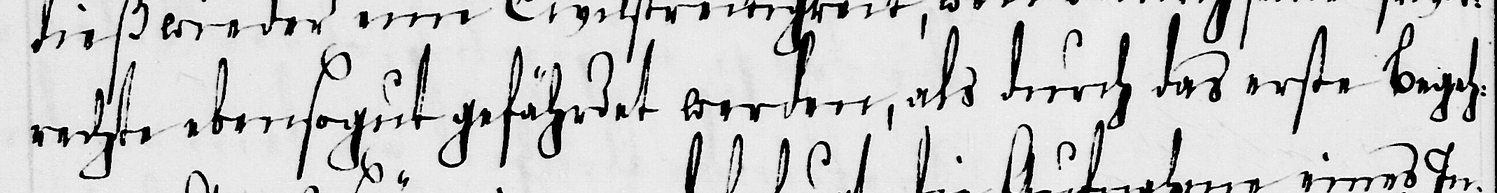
trechte ebensogut gefährdet werden, als durch das erste Bege¬
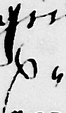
t¬
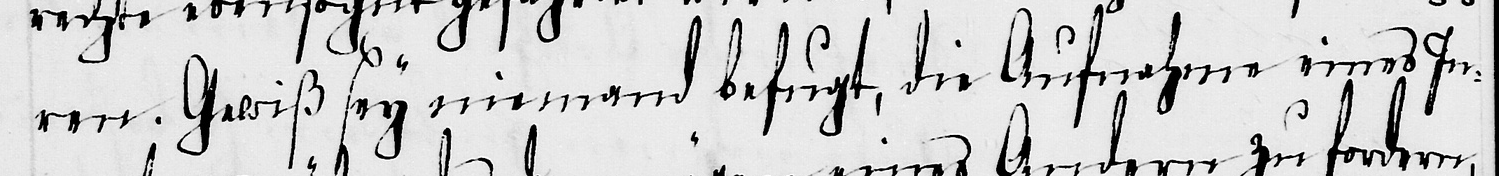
hren. Gewiß sey niemand befugt, die Aufnahme eines In¬
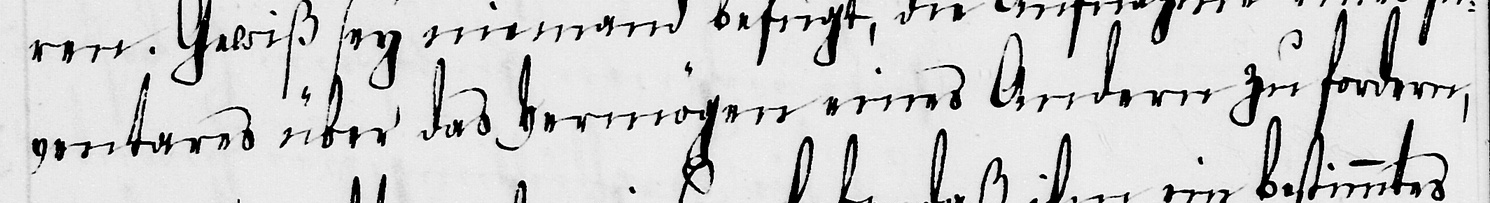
ventares über das Vermögen eines Andern zu fordern,
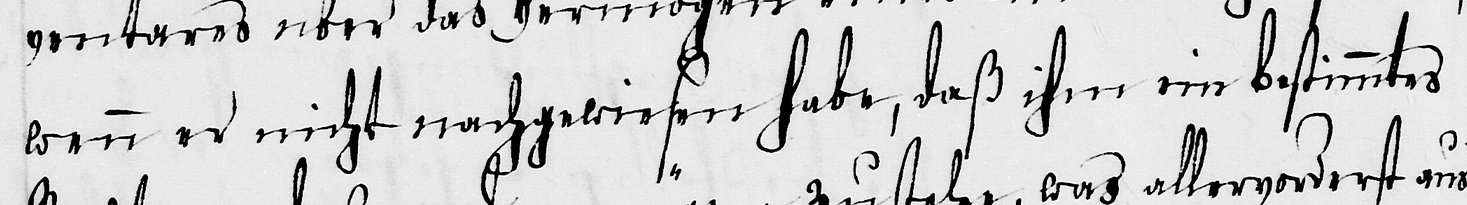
wenn er nicht nachgewiesen habe, daß ihm ein bestimmtes
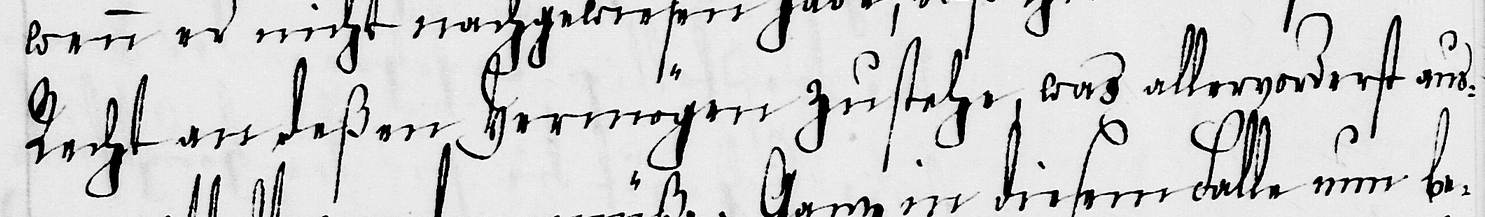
Recht an deßen Vermögen zustehe, was allervorderst au¬
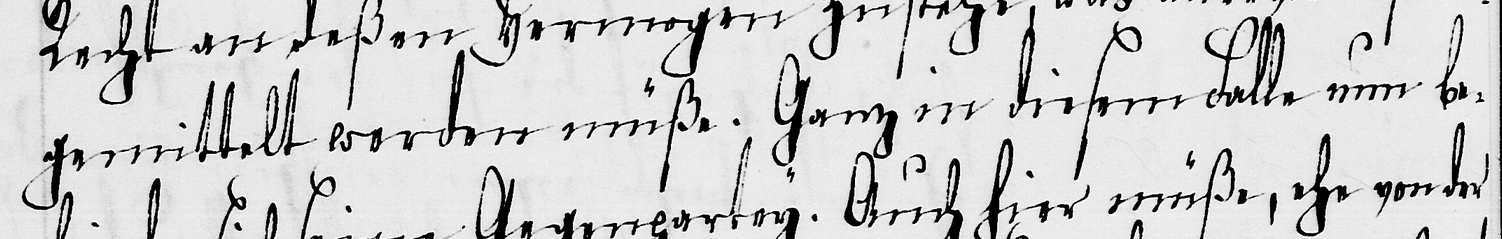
sgemittelt werden müße. Ganz in diesem Falle nun b¬
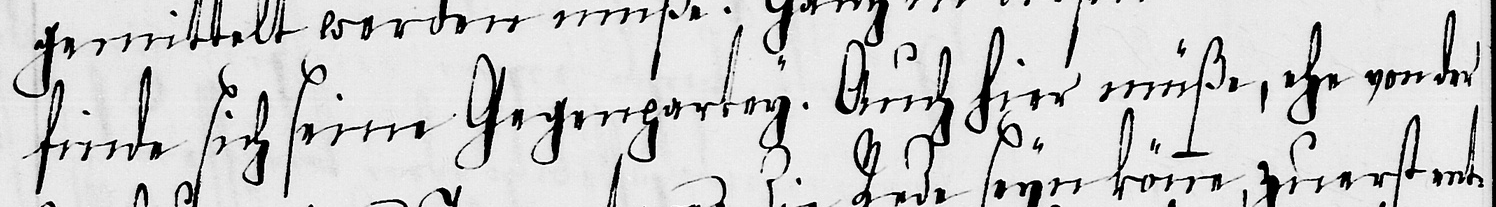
efinde sich seine Gegenpartey. Auch hier müße, ehe von d¬
